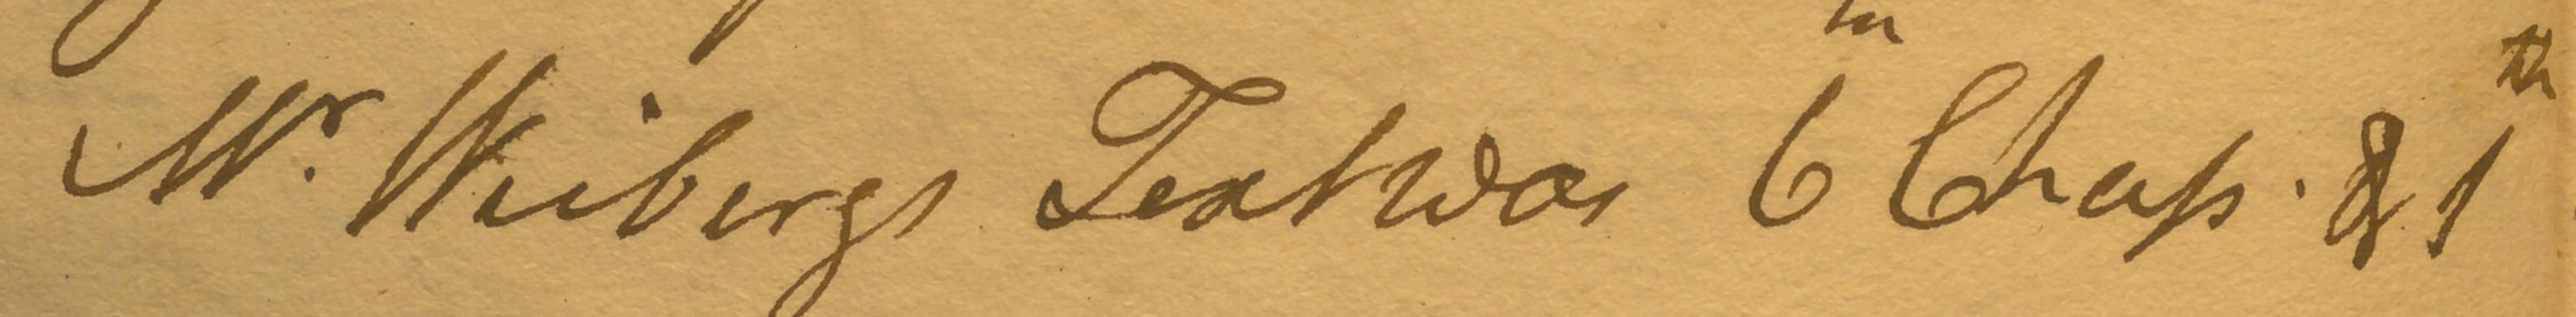M^r Weibergs Text was 6^th Chap & 1^th
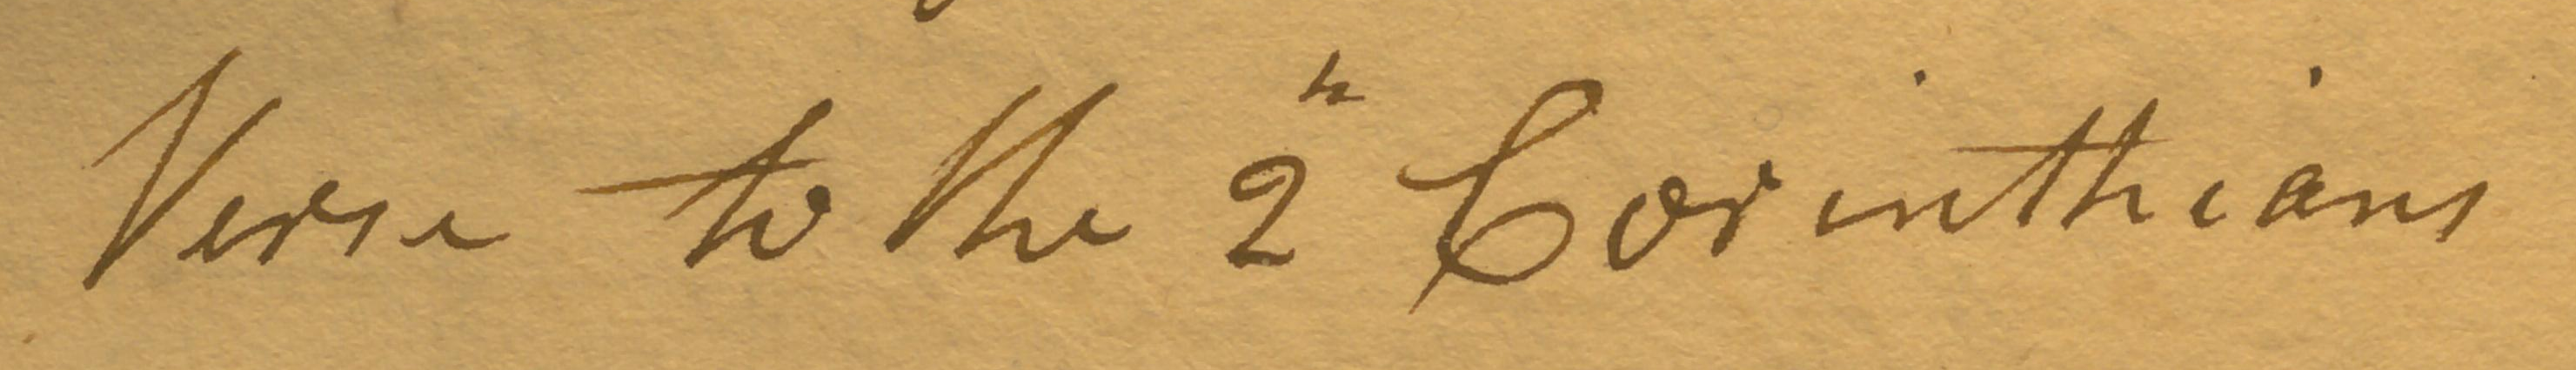Verse to the 2^th Corinthians
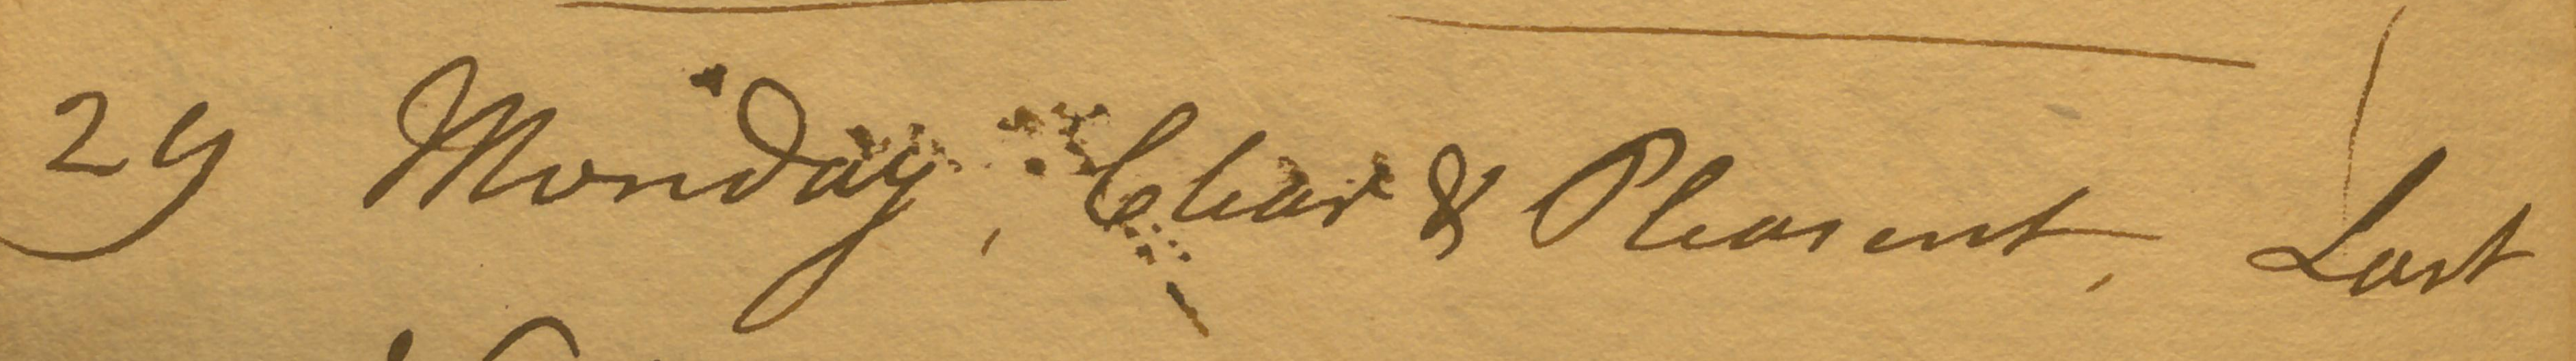29 Monday Clear & Pleasent Last
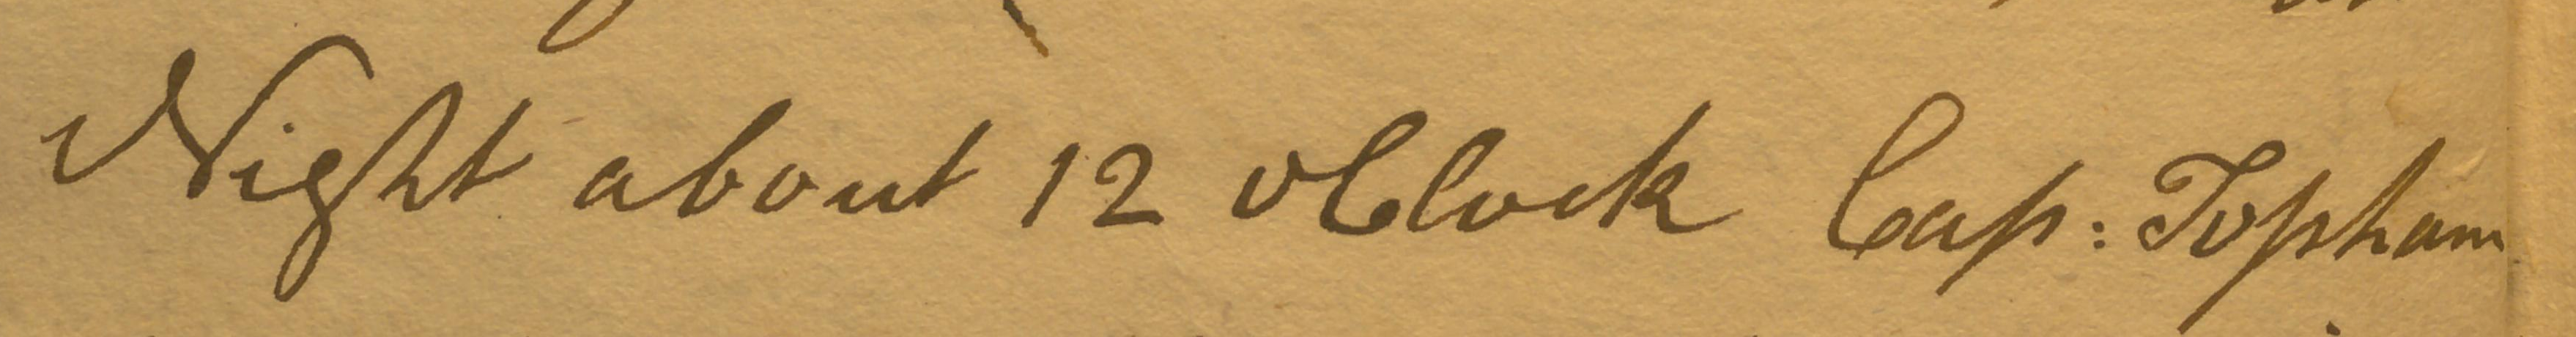Night about 12 oClock Cap: Topham
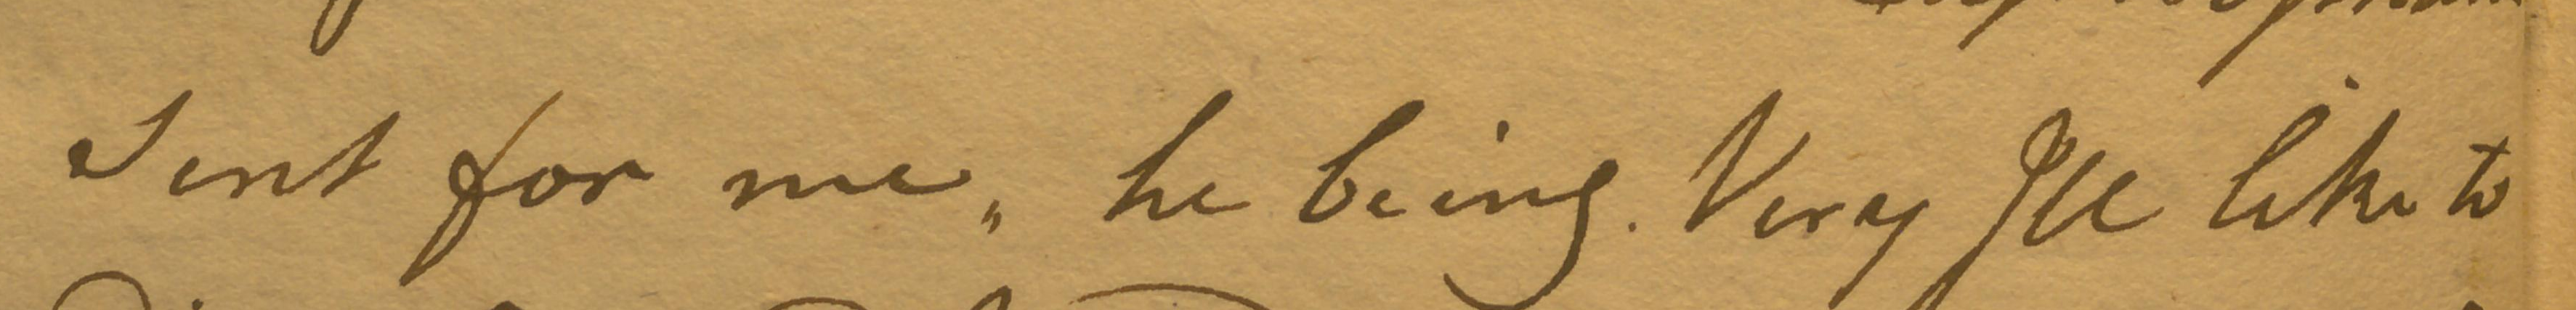sent for me, he being Very Ill like to
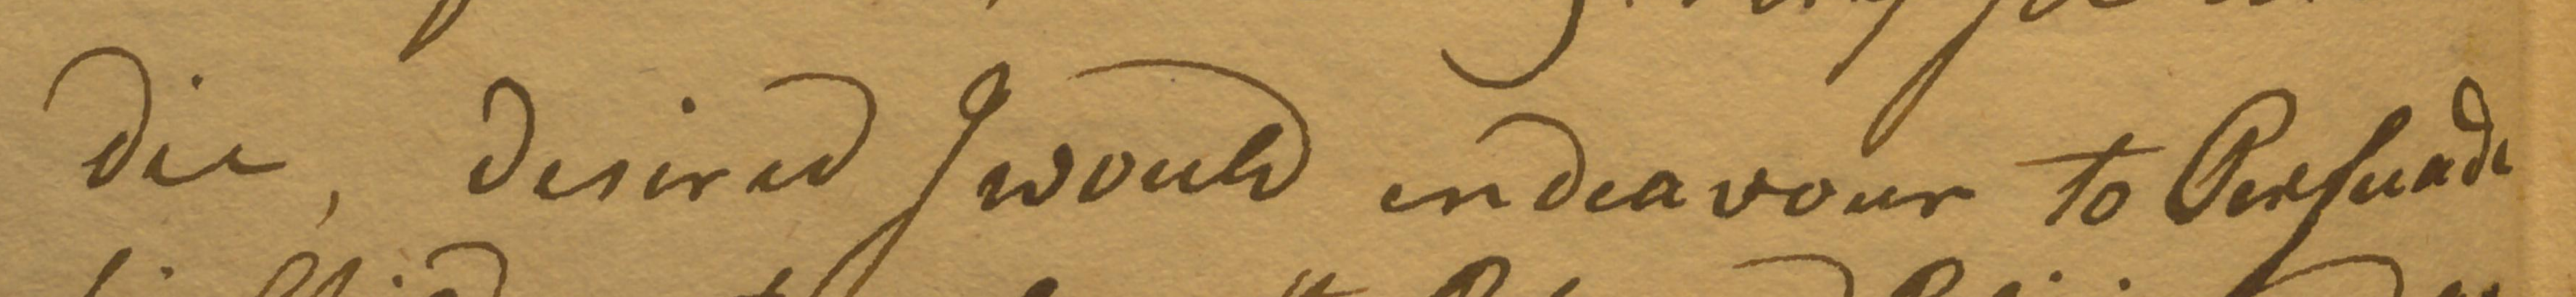die. desired would endeavour to Persuade
